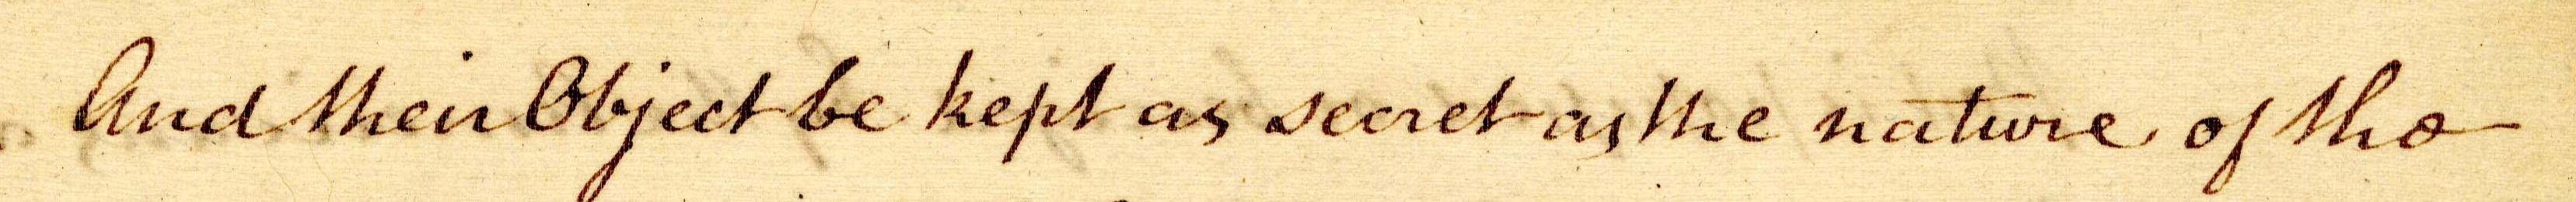And their Object be kept as secret as the nature of the
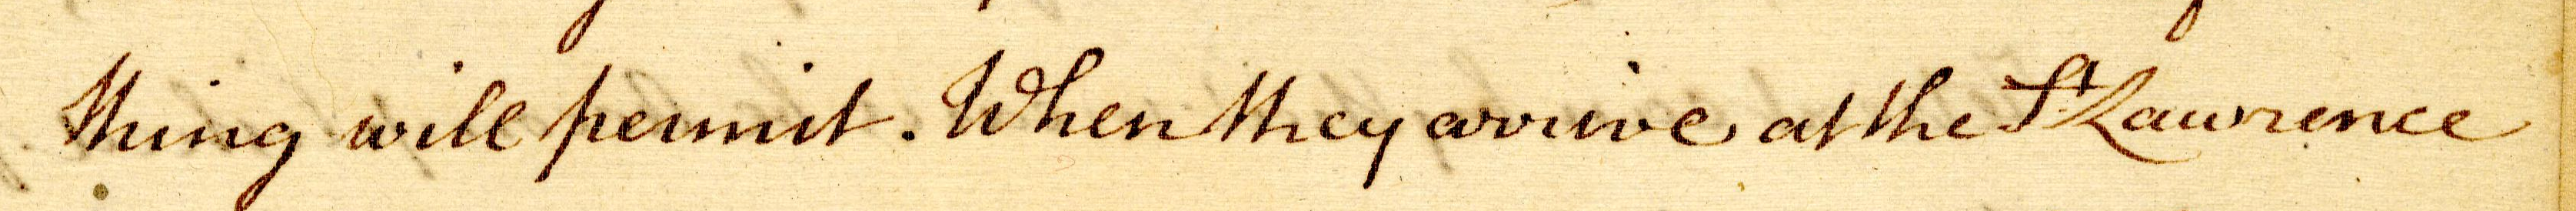thing will permit. When they arrive at the S^t. Lawrence
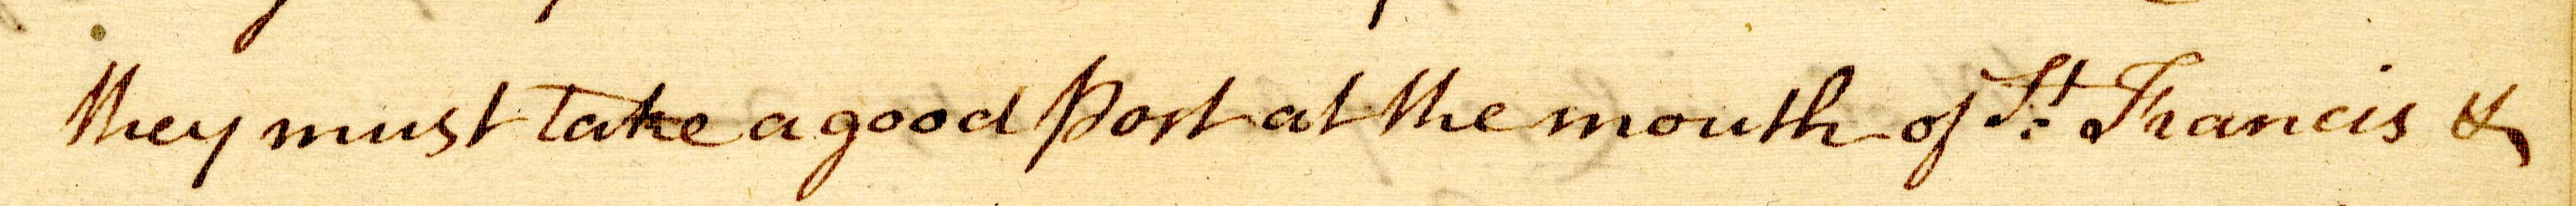they must take a good Post at the mouth of S^t: Francis &
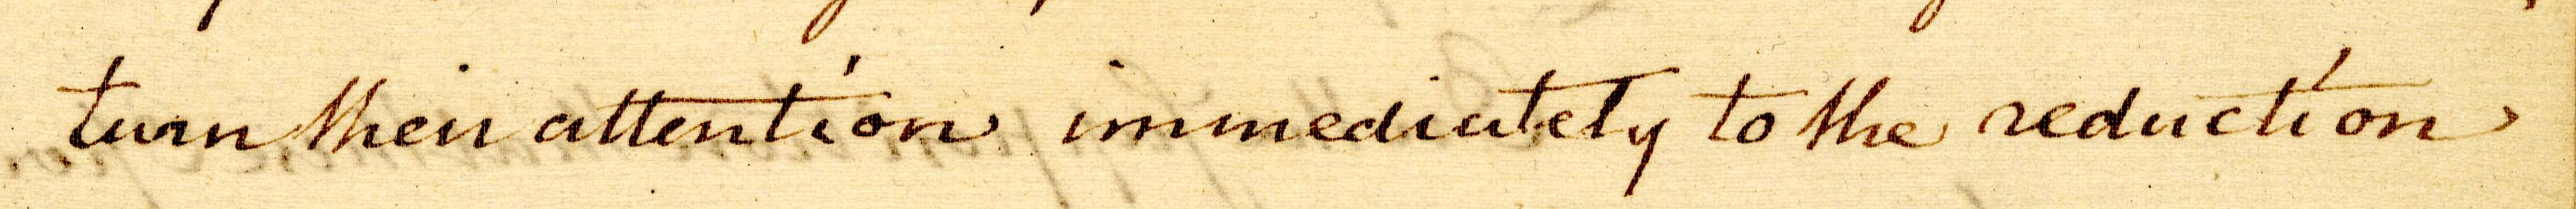turn their attention immediately to the reduction
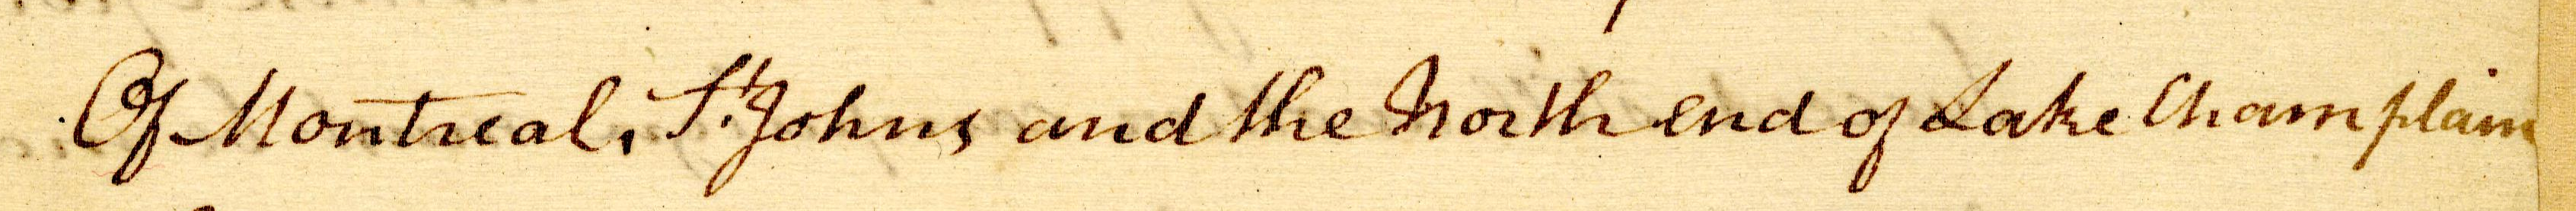Of Montreal; S^t. Johns and the North end of Lake Champlain
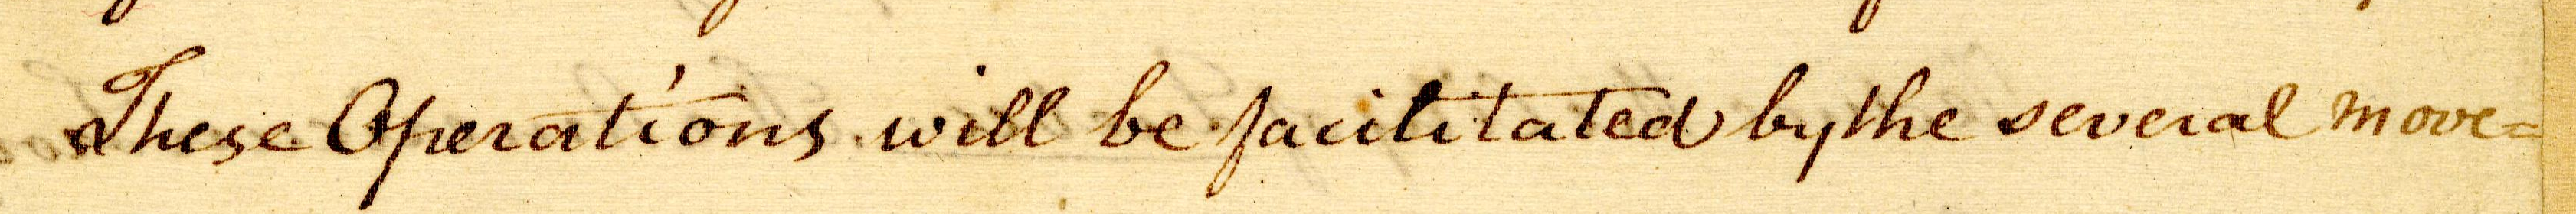These Operations will be facilitated by the several move-
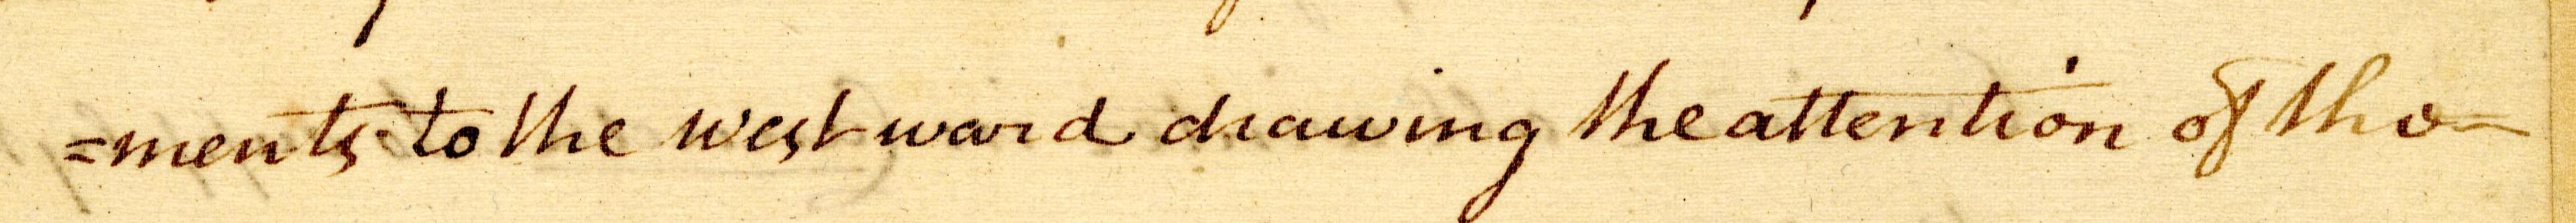-ments to the west ward drawing the attention of the
